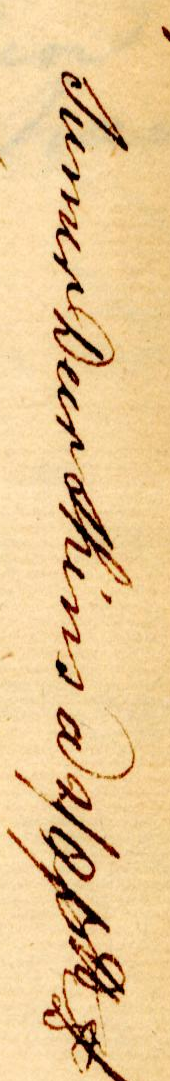Sumer Deer skins @ 2s9 per ^lb £
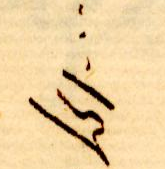15s
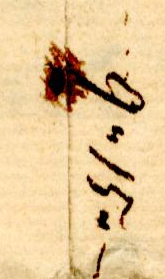9..15..
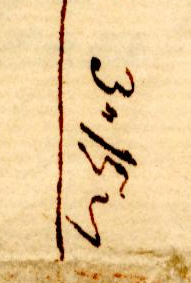3..15-
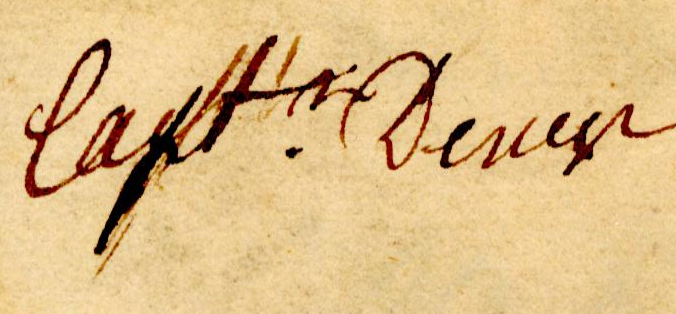Capt^n Denver
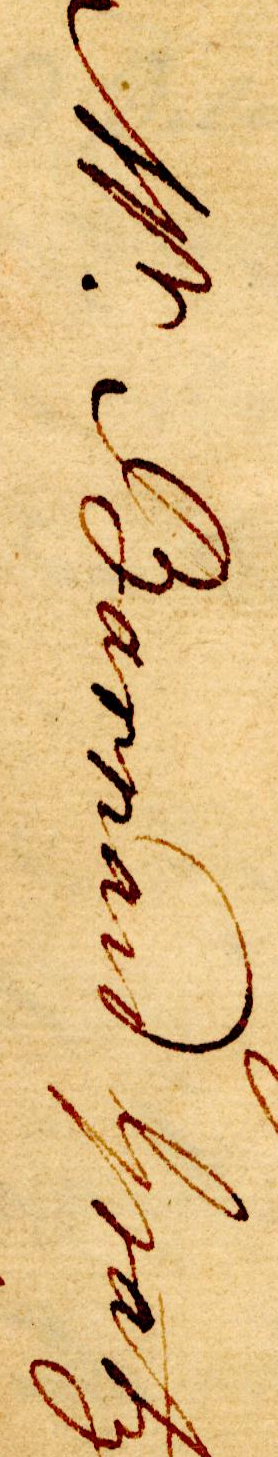M^r. Barnard Gratz
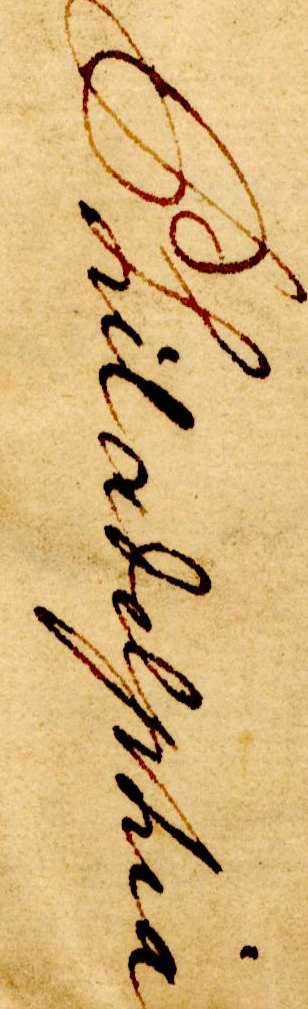Philadelphia
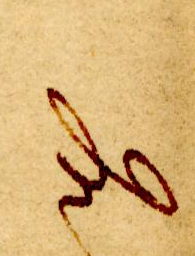In
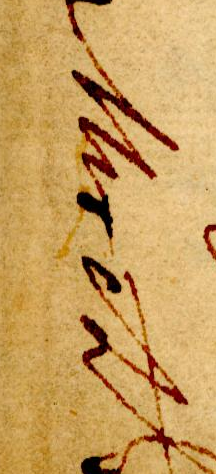Merch^t
